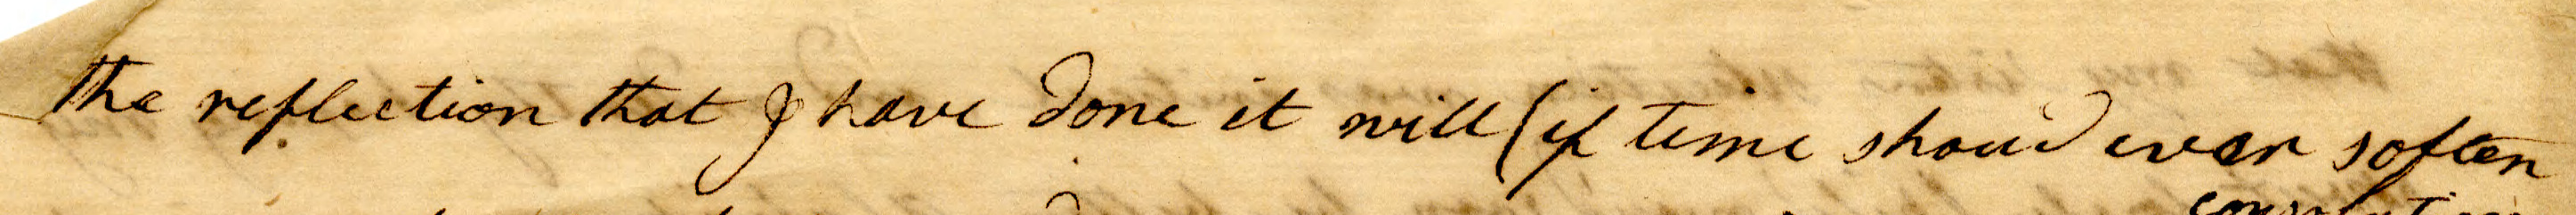the reflection that I have done it will (if time shoud ever soften
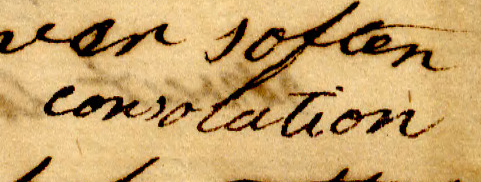consolation
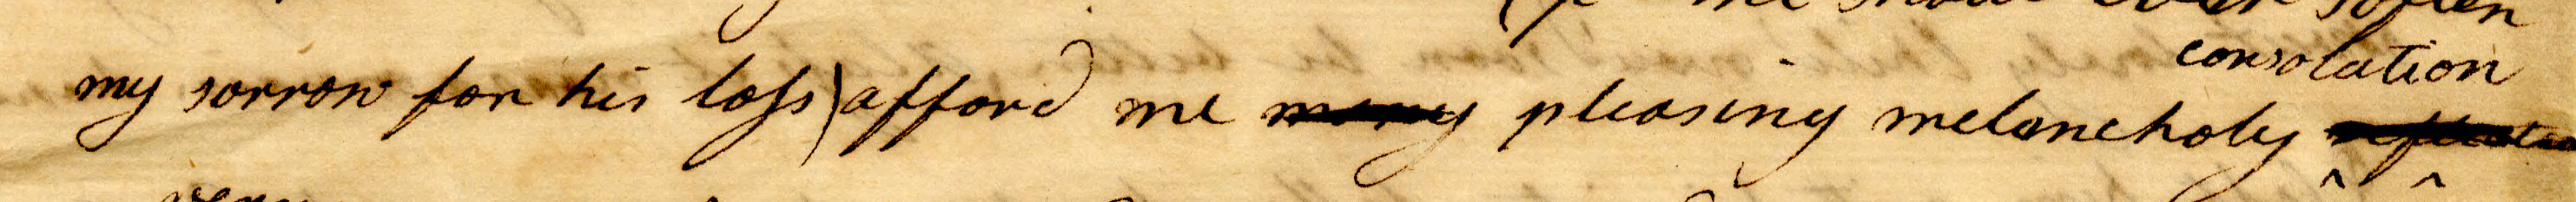my sorrow for his loss) afford me [many] pleasing melancholy ^ ^ [________]
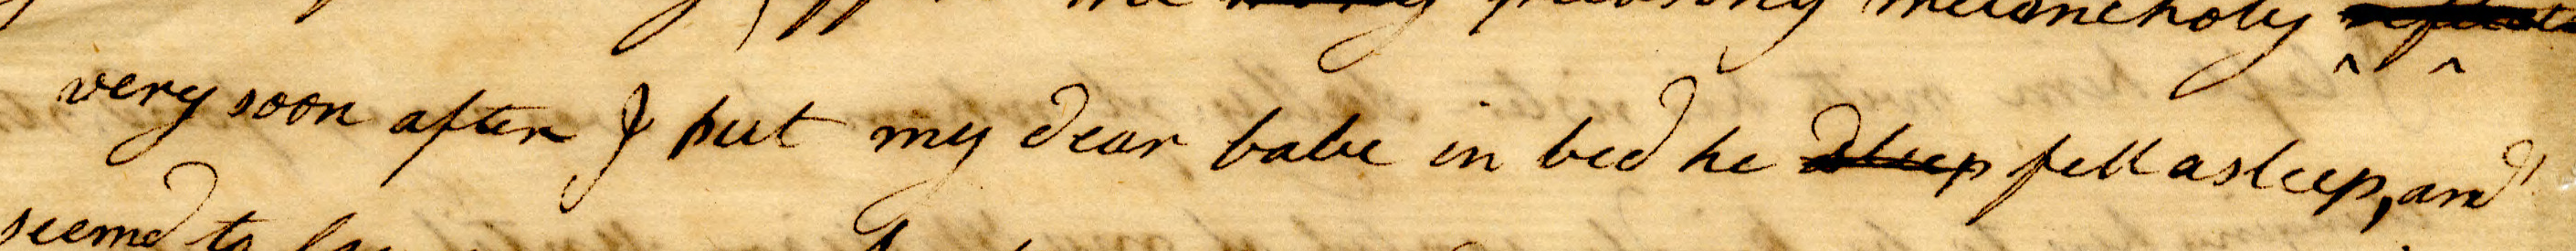very soon after I put my dear babe in bed he [sleep] fell asleep, and
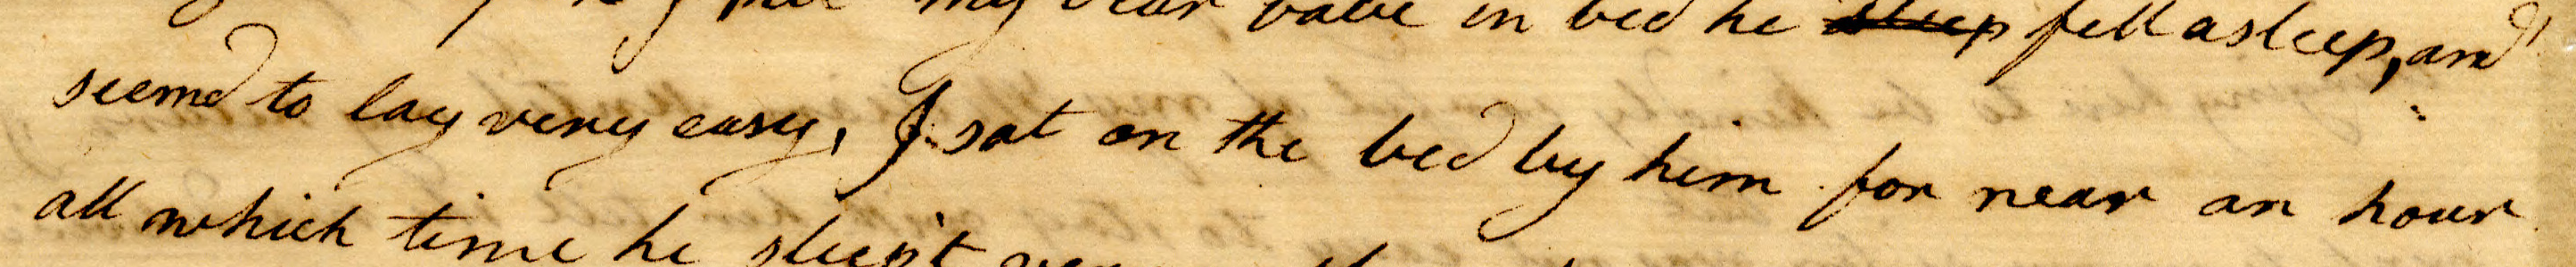seemd to lay very easy, I sat on the bed by him for near an hour
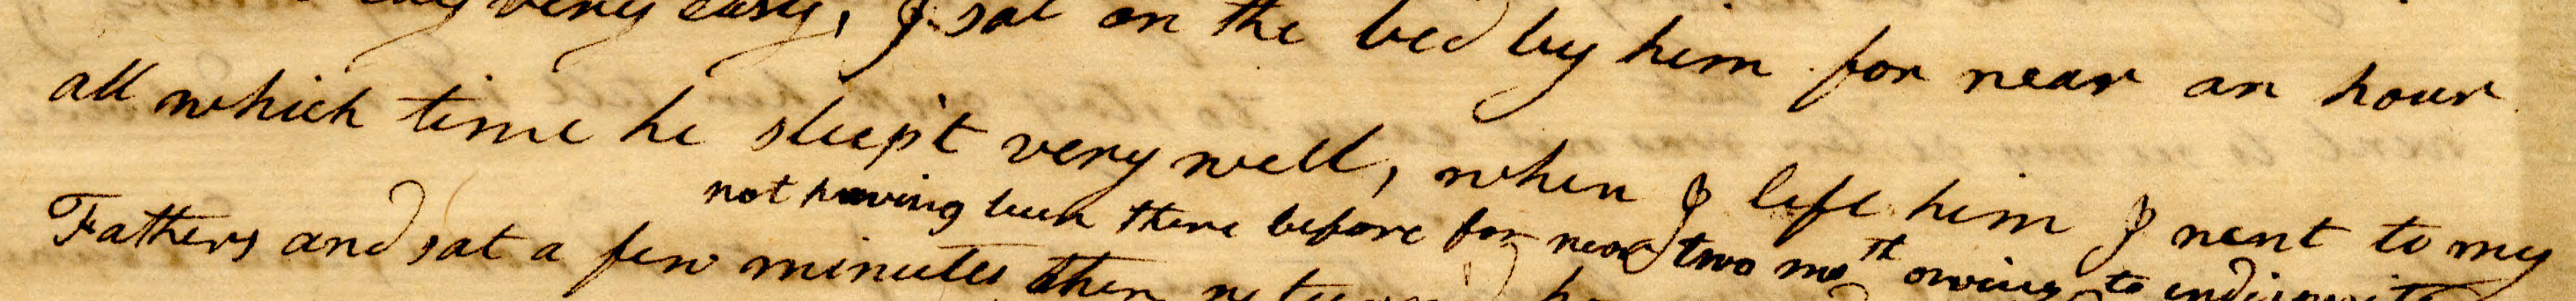all which time he slept very well, when I left him I went to my
